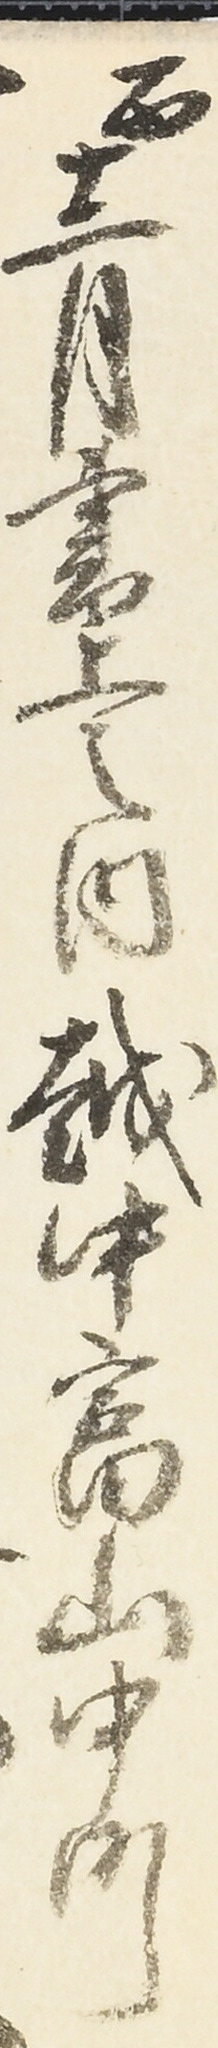酉十二月書上之内越中富山中町
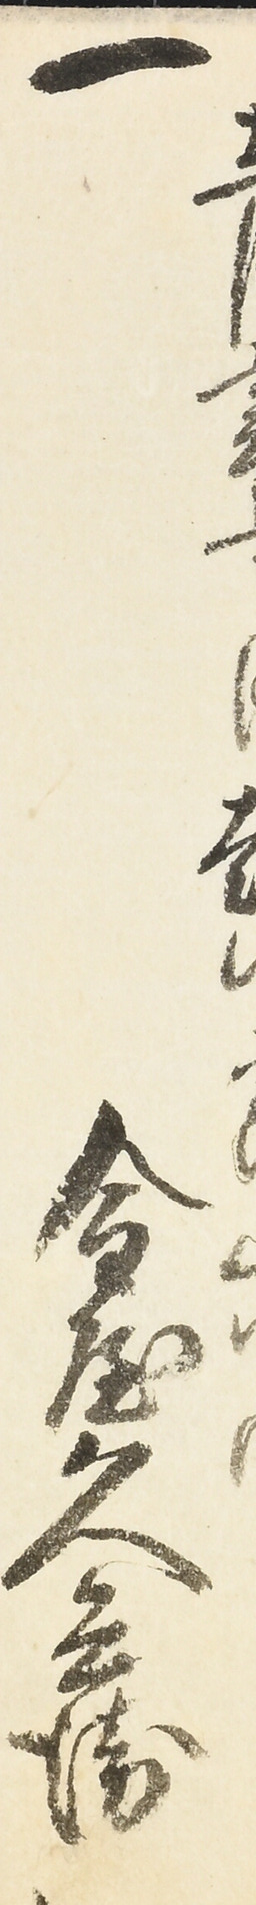一金屋久兵衛
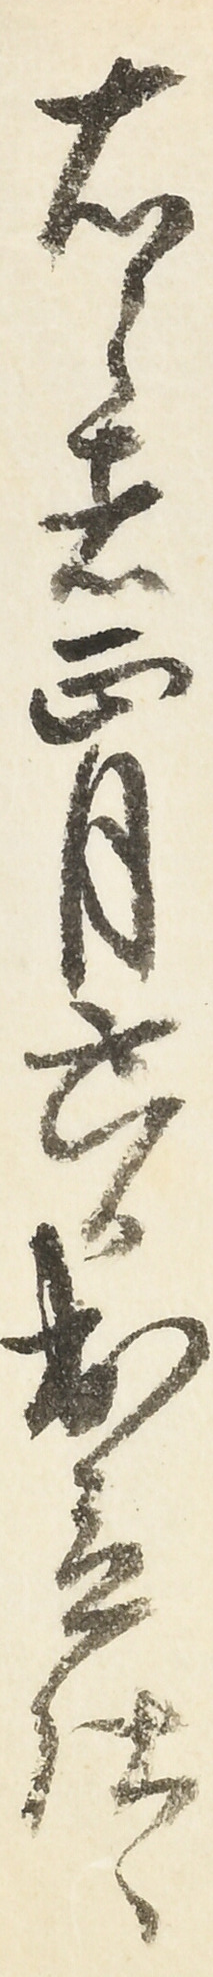右之者正月六日出立仕候

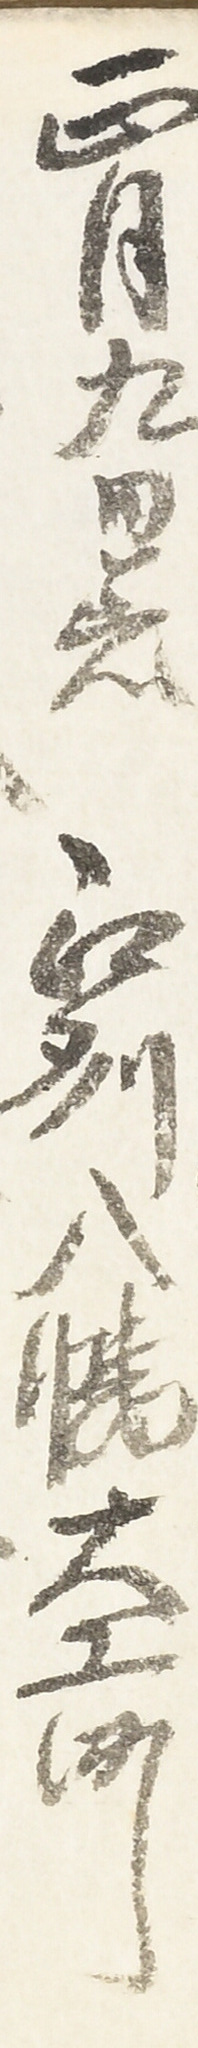正月九日着江州八幡大工町
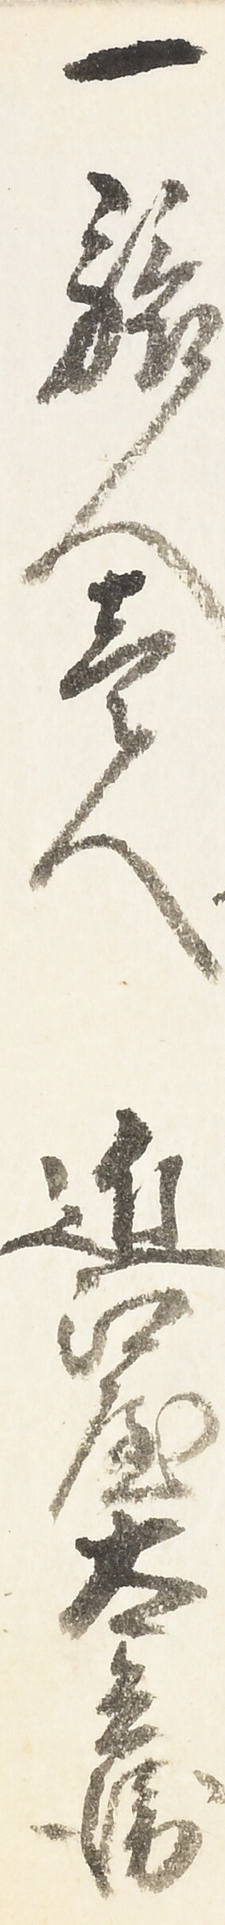一旅人壱人近江屋太兵衛
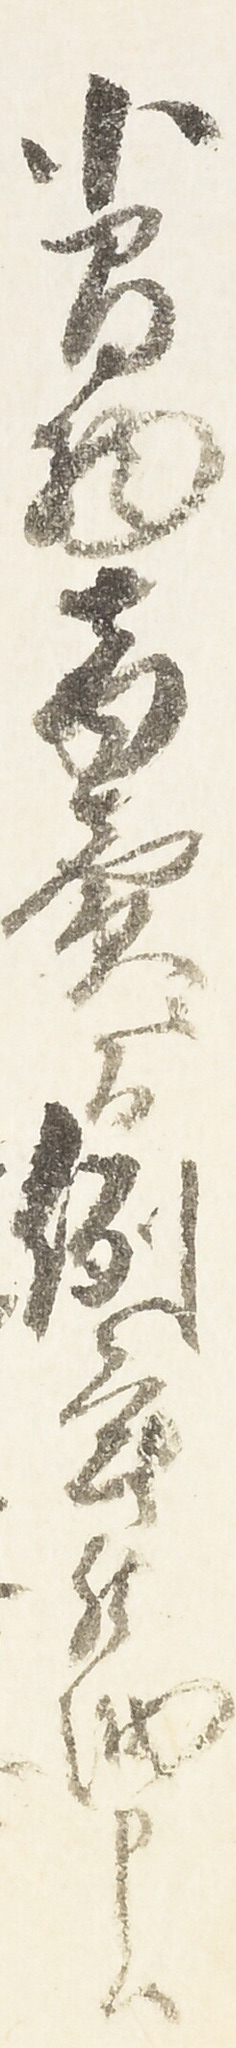小間物商売ニ而例年罷越申候
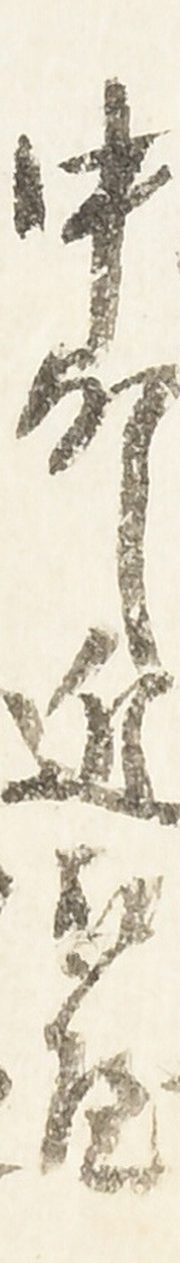中町近江屋
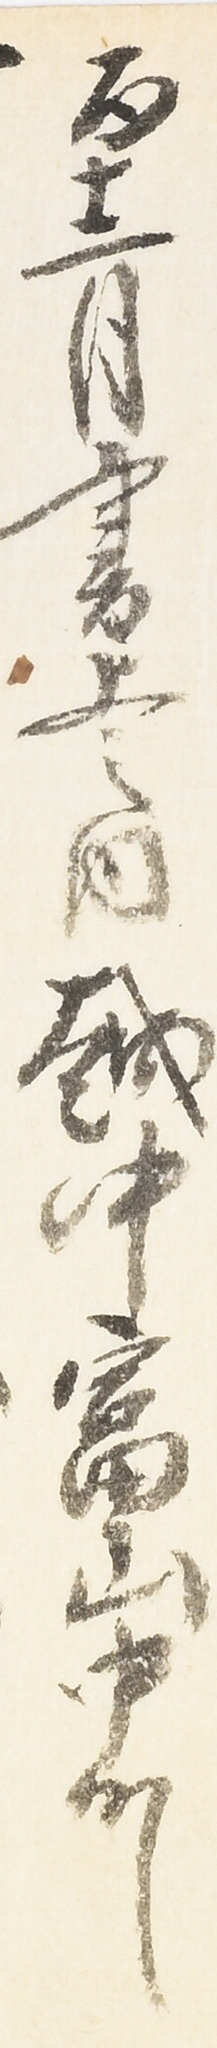酉壱弐月書上之内越中富山中町
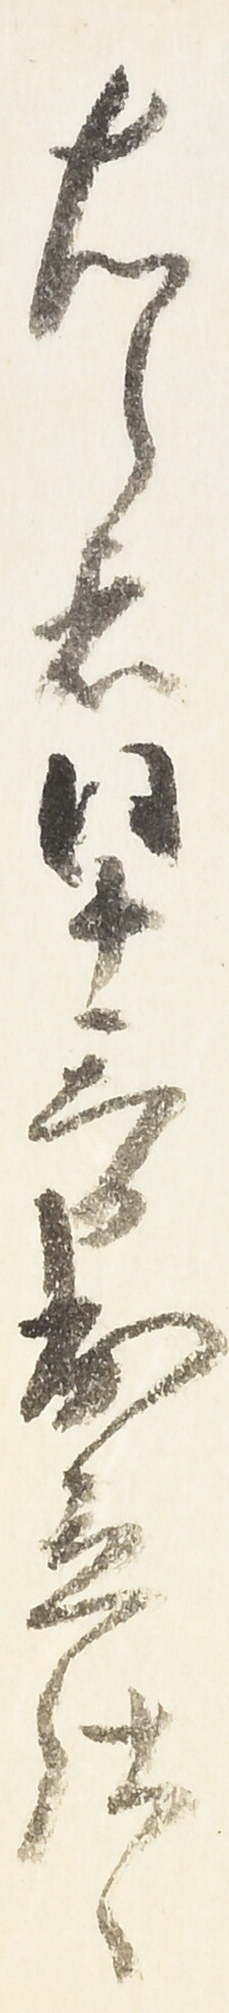右之者同十三日出立仕候
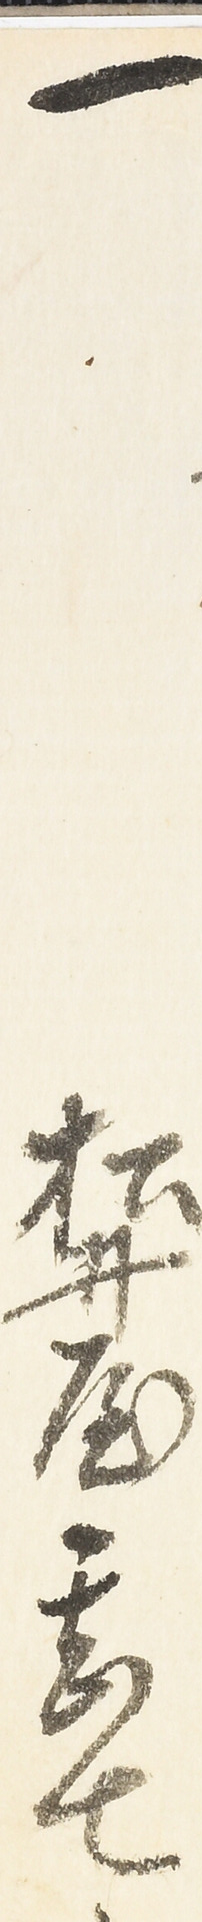一松井屋甚七・
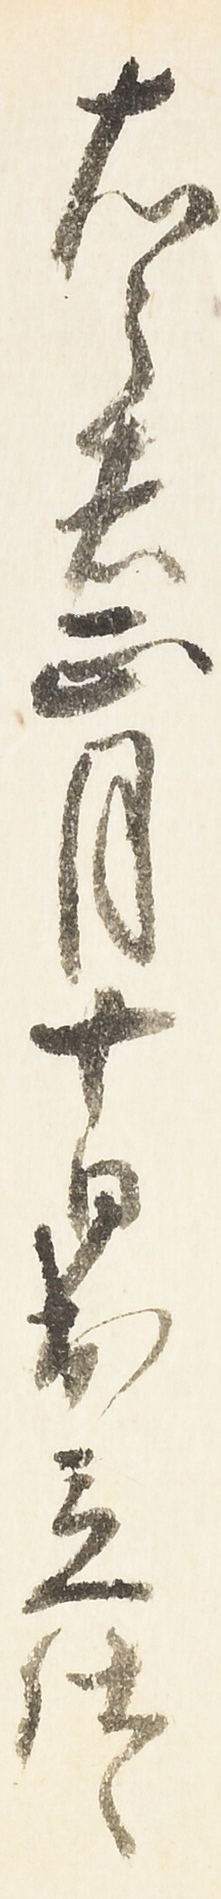右之者正月十日出立仕候
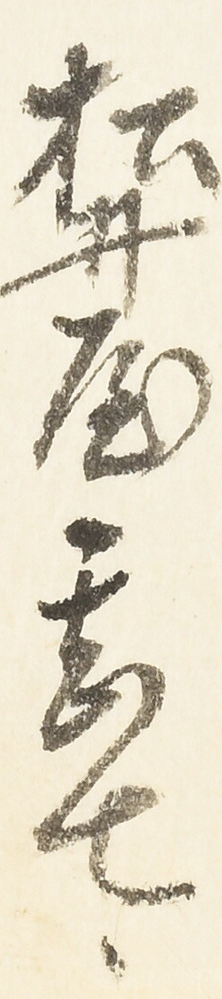一松井屋甚七・
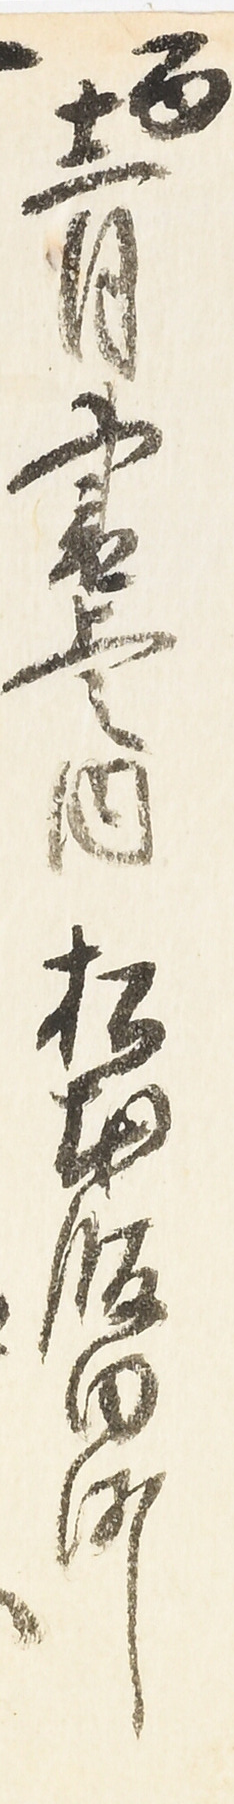十二月書上之内松本飯田町
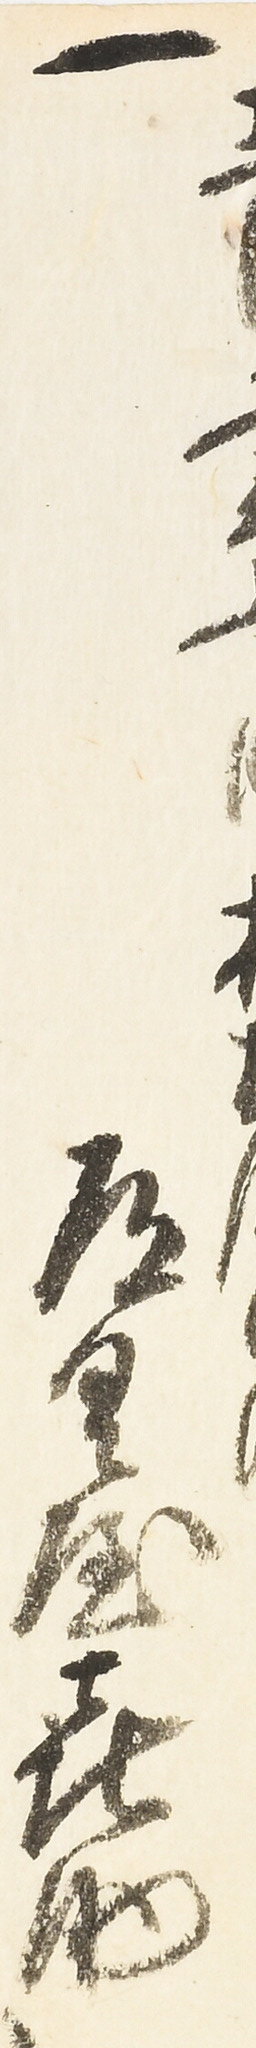一道具屋喜助
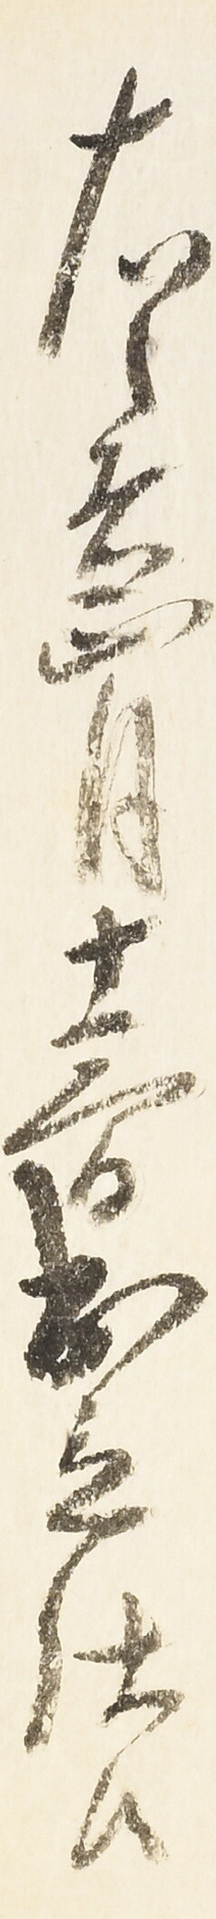右之者正月十日出立仕候
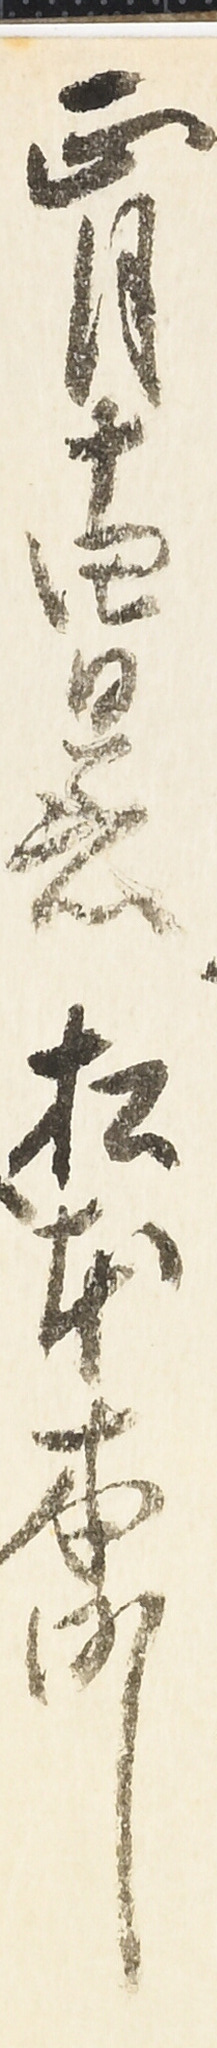正月十四日着松本本町
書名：町中旅人泊控帳
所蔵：伊那市立高遠町図書館・合同会社AMANE
